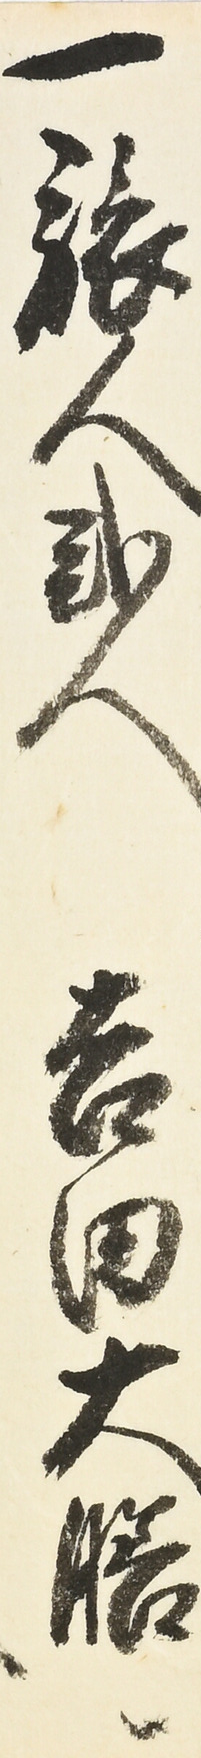一旅人弐人吉田大膳・
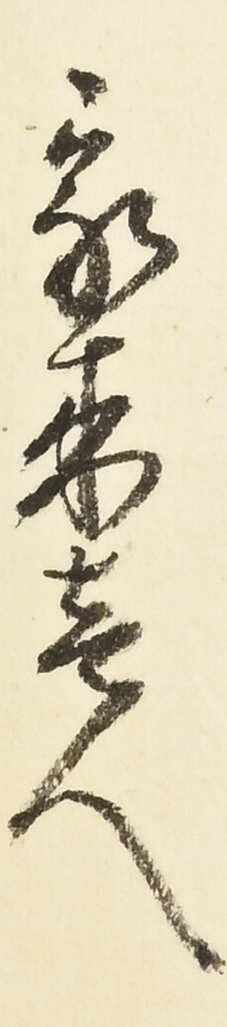家来壱人
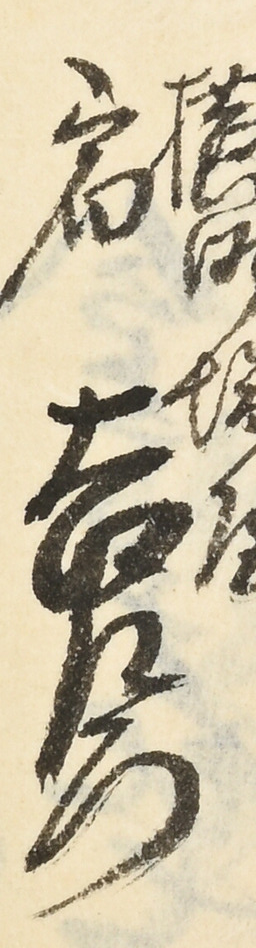宿吉左衛門
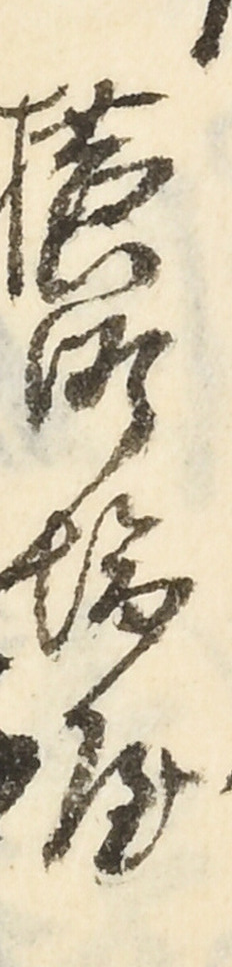横町塩屋
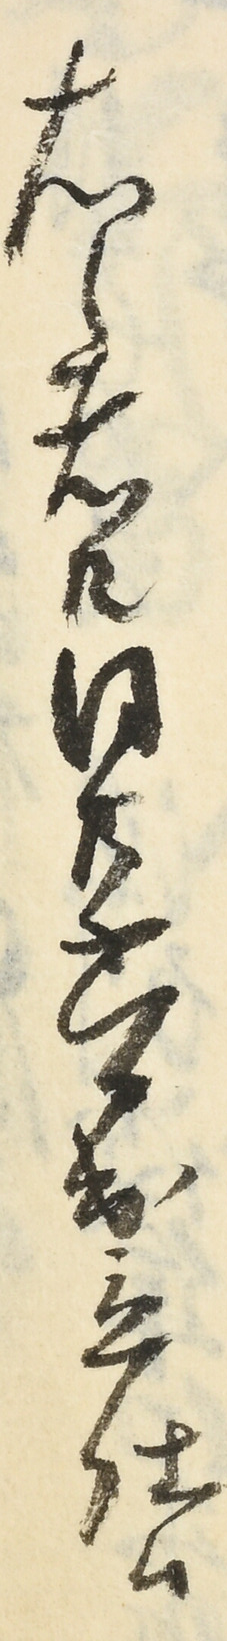右之者同十九日出立仕候

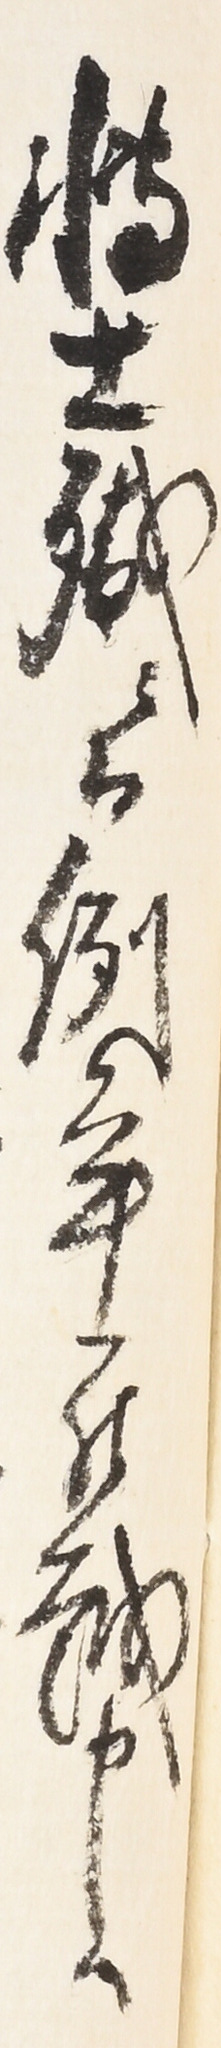転士職ニ而例年罷越申候
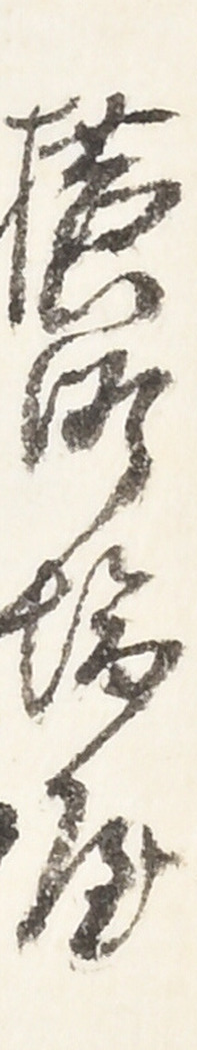横町塩屋
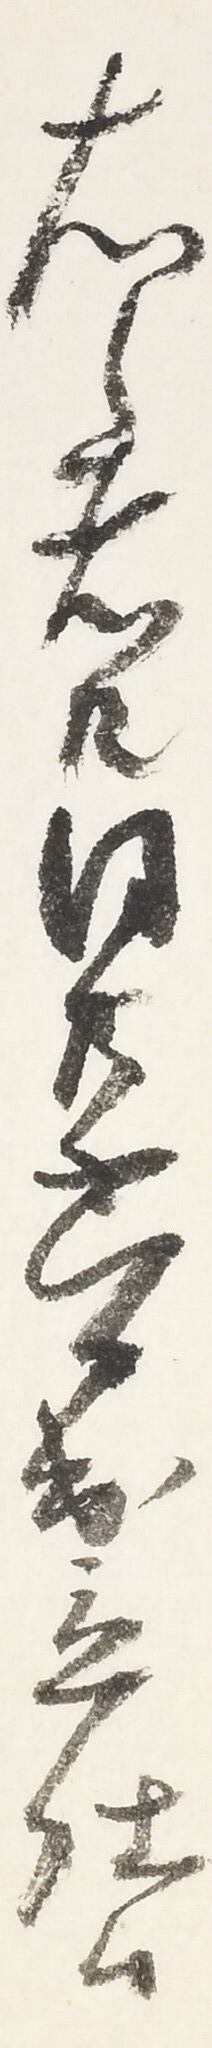右之者共同廿六日出立仕候
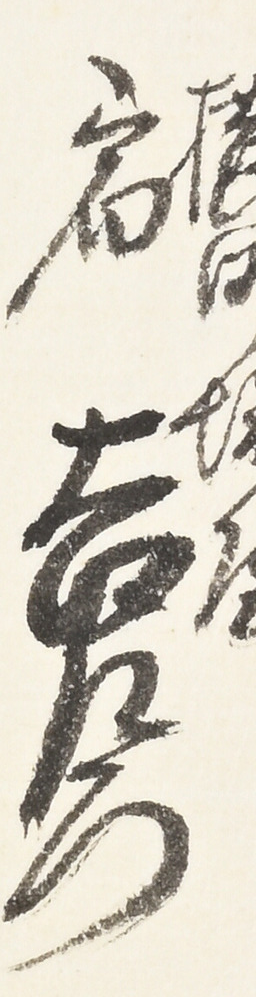宿吉左衛門
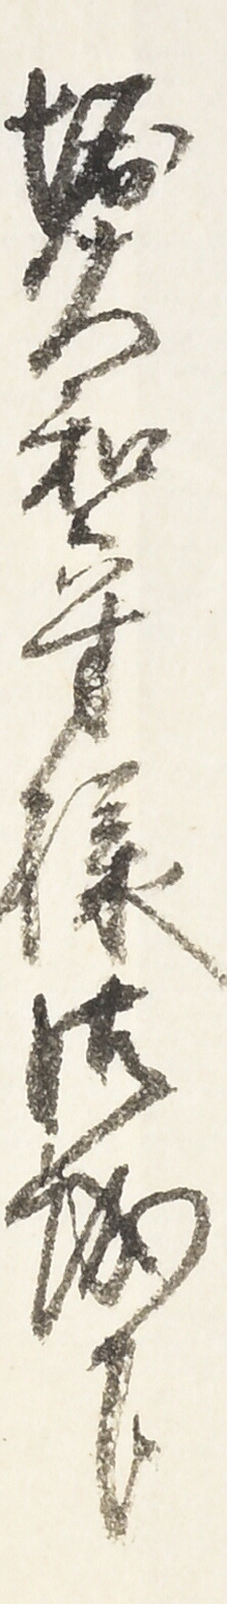堀大和守様御城下
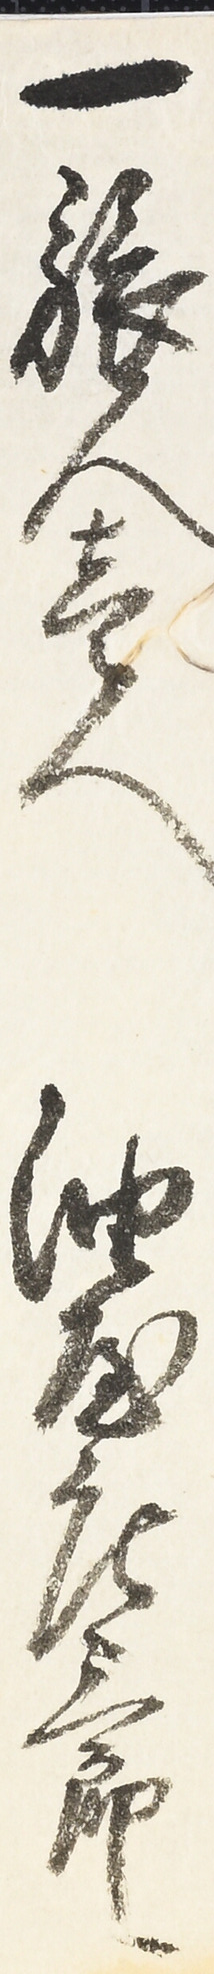一旅人壱人油屋庄三郎・
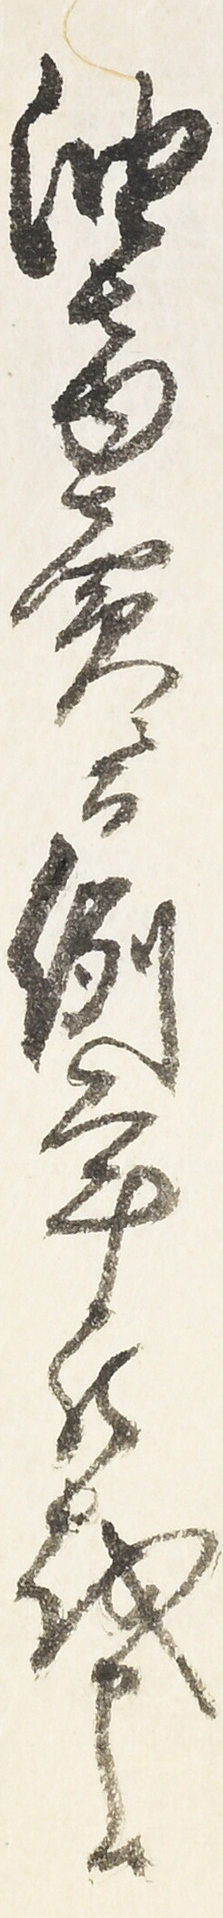油商売ニ而例年罷越申候
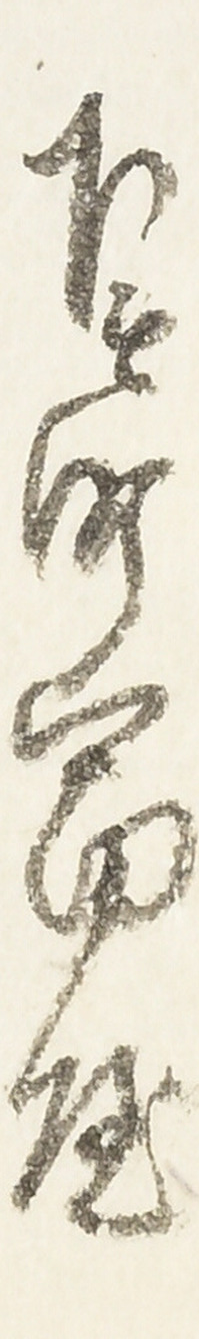下モ町冨屋
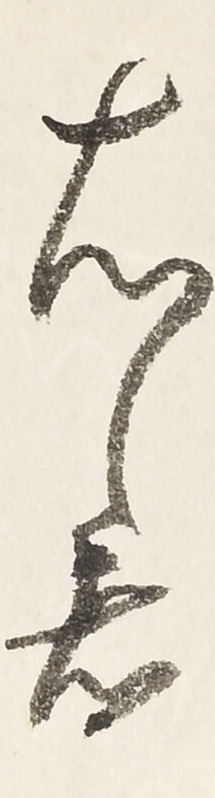右之者
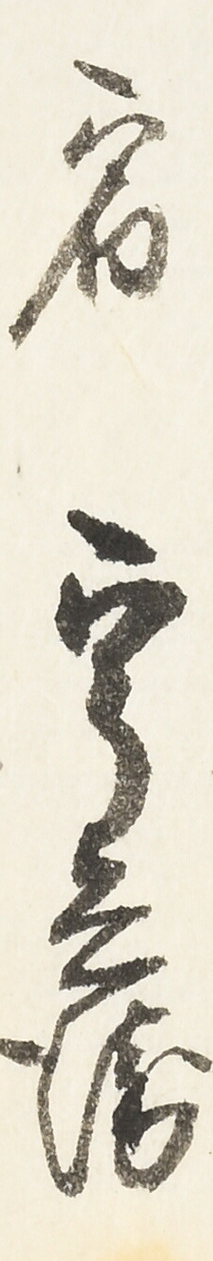宿宇兵衛
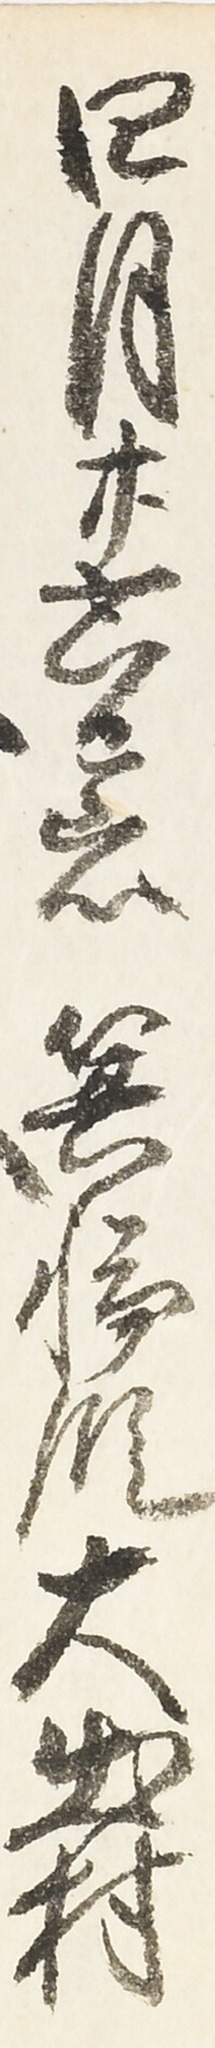四月廿六日着箕輪領大出村
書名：町中旅人泊控帳
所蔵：伊那市立高遠町図書館・合同会社AMANE
